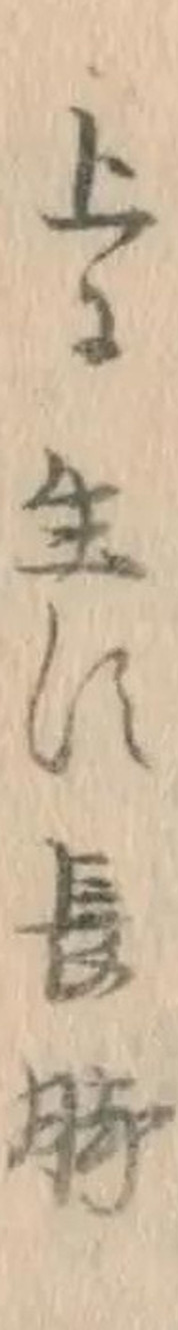上に生す長脚
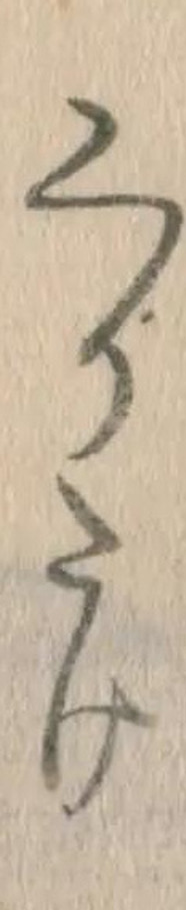くりたけ
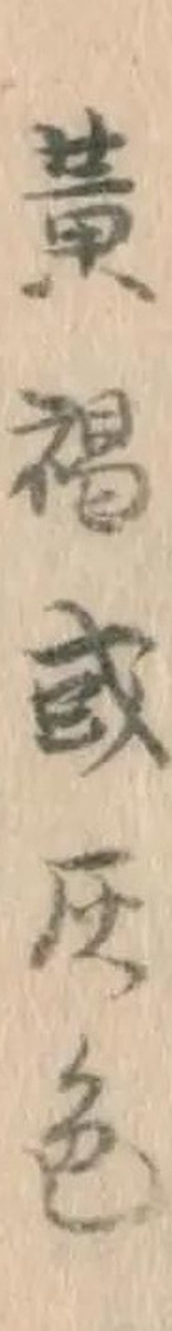黄褐或灰色
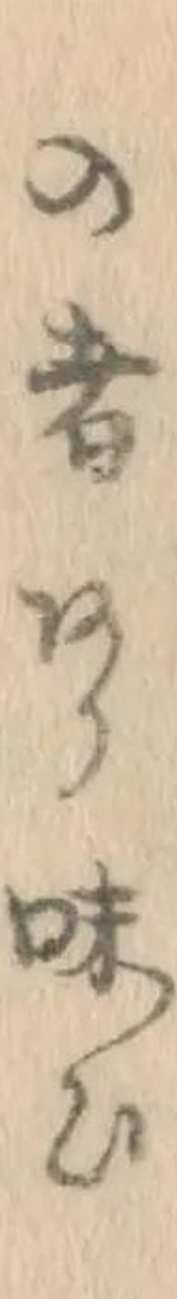の者あり味ひ
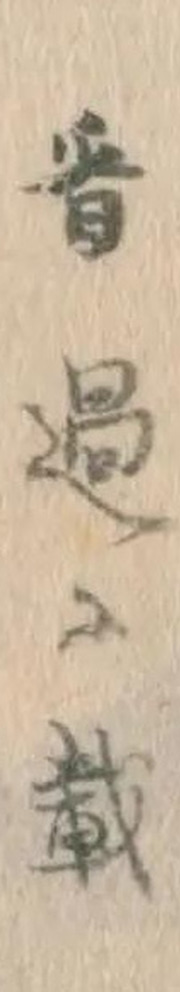看過に載
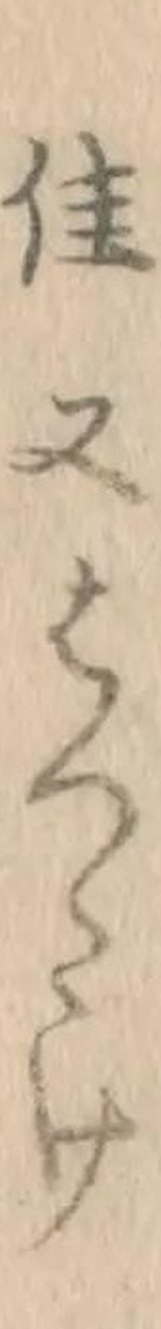佳又はつたけ
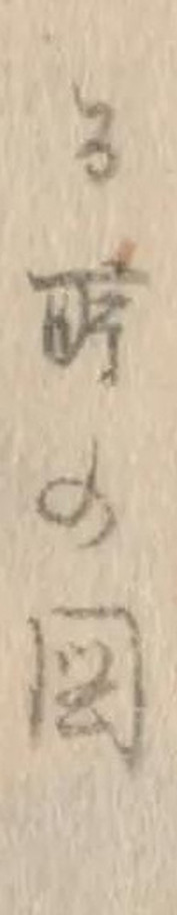る所の図
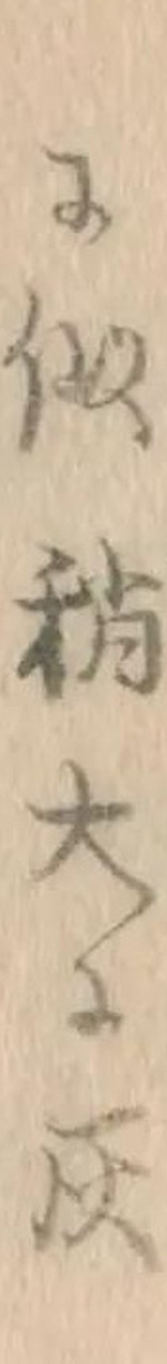に似稍大に灰
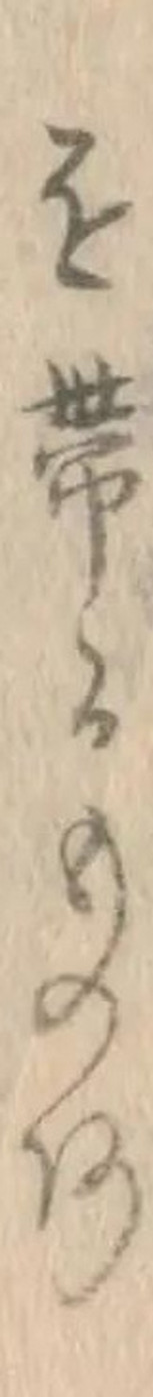を帯るものあ
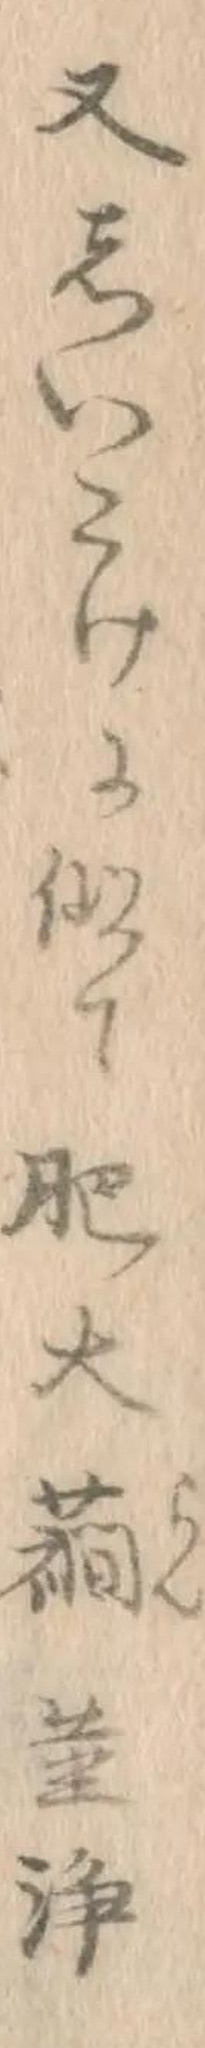又しいたけに似て肥大茎浄
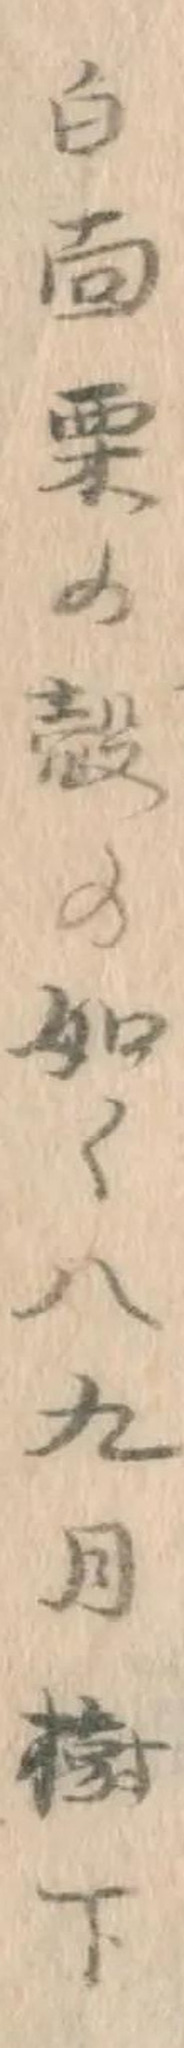白面栗の殻の如く八九月樹下
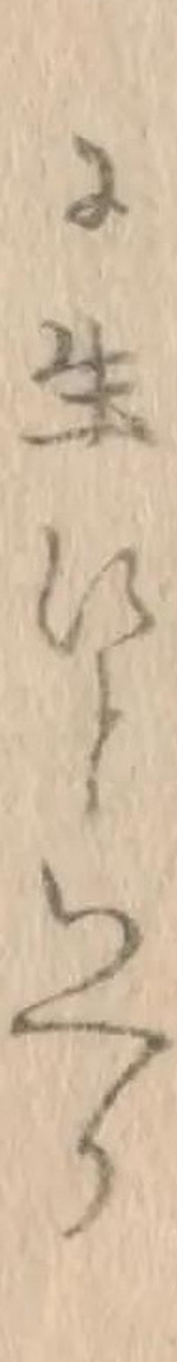に生すといへり

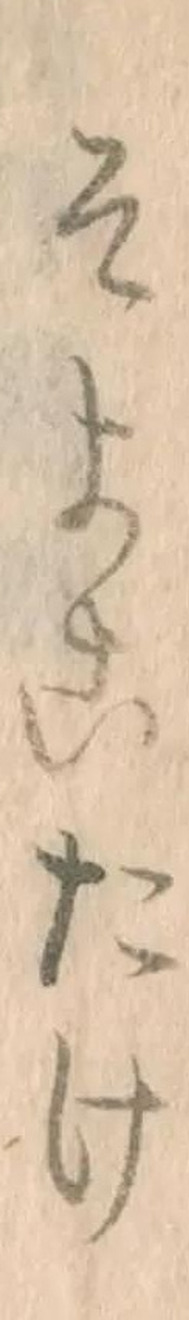そよこたけ
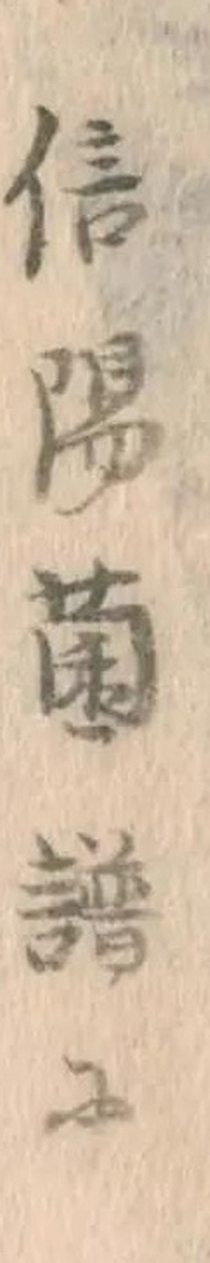信陽菌譜に
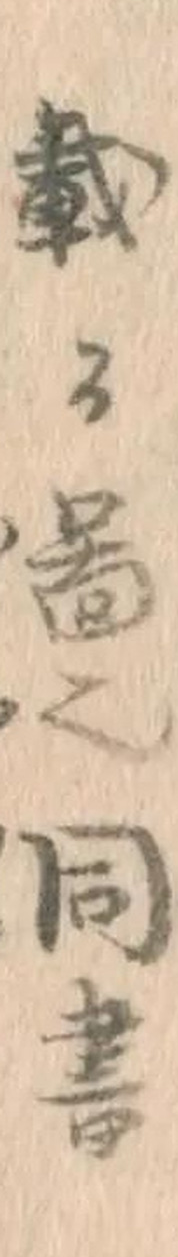載る図也同書
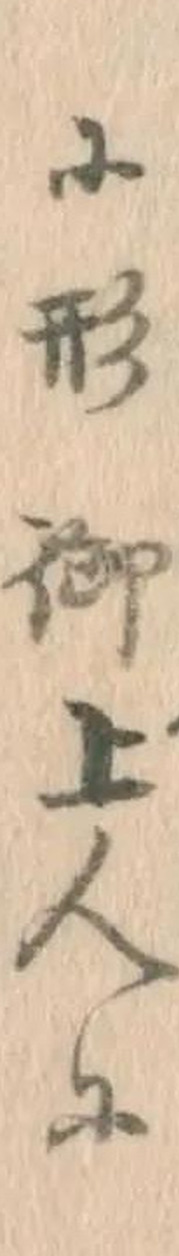に形御上人に
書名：本草図譜. 巻55-57
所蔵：国立国会図書館 National Diet Library, JAPAN
